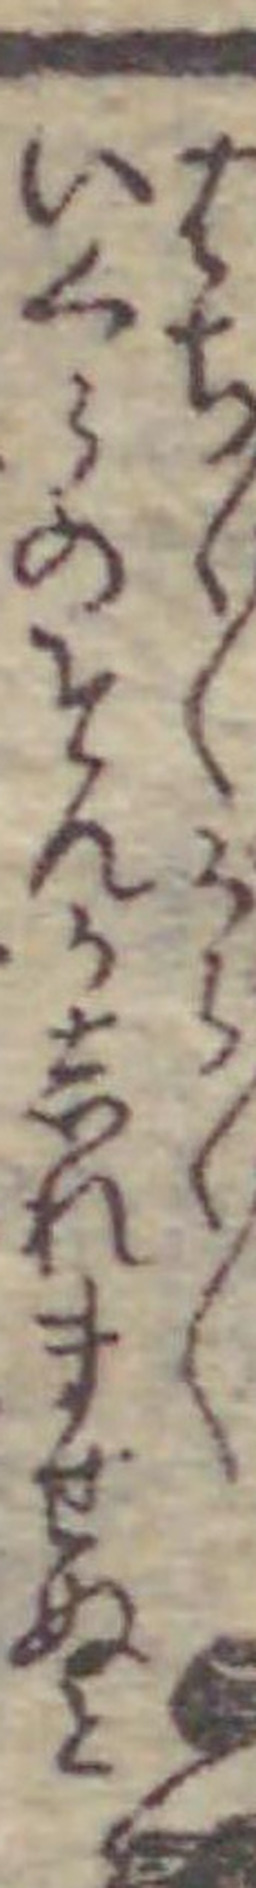いくらのそんかしれませぬと
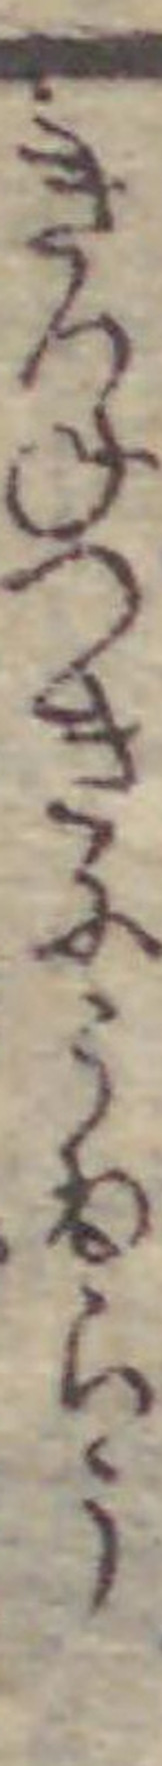きつねつきにうゐらう
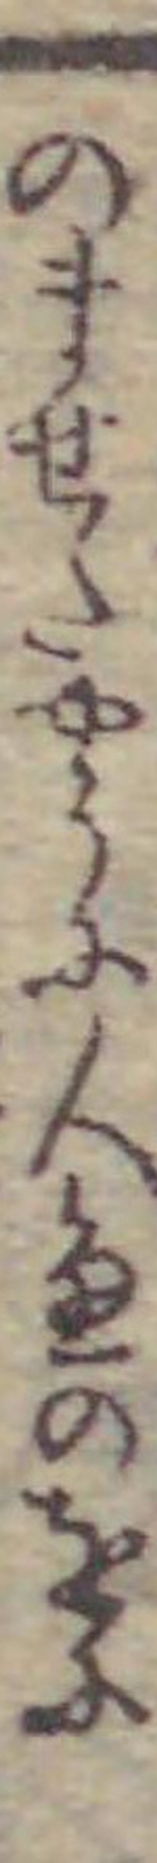のませたやうに人魚のをに
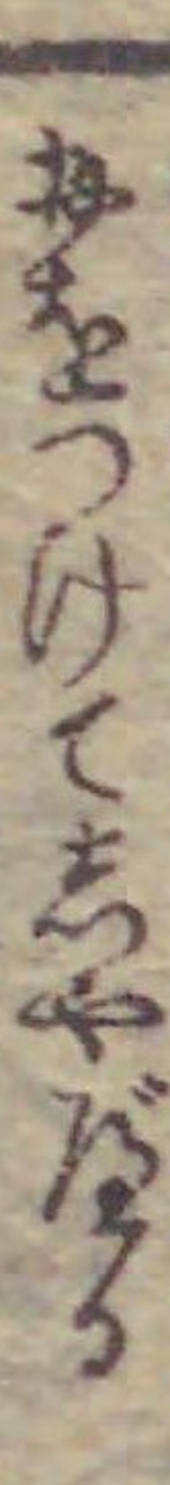おをつけてしやべる

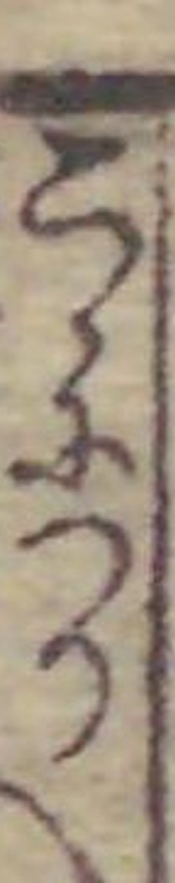こゝにつり
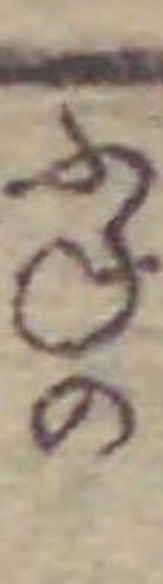ふねの
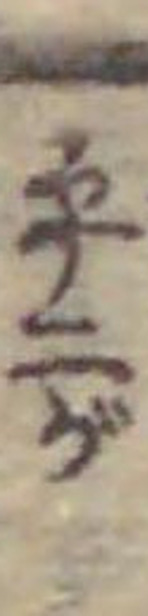平二が
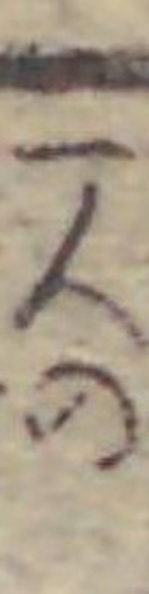一人の
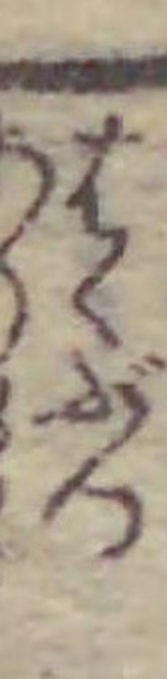はくぶつ
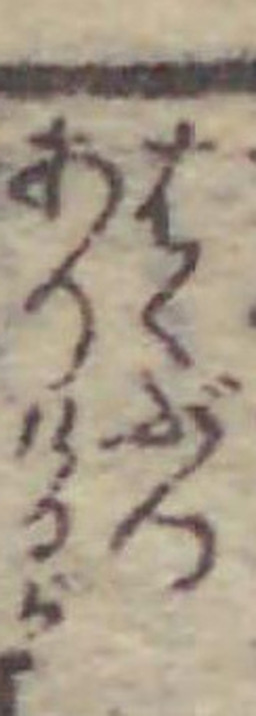ありけるが
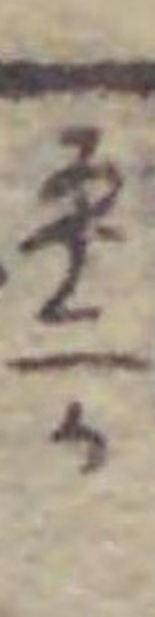平二が
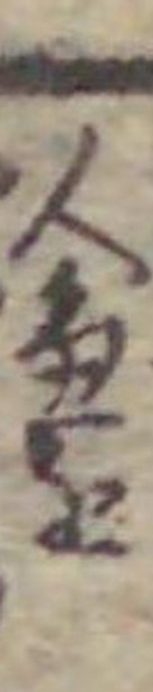人魚を
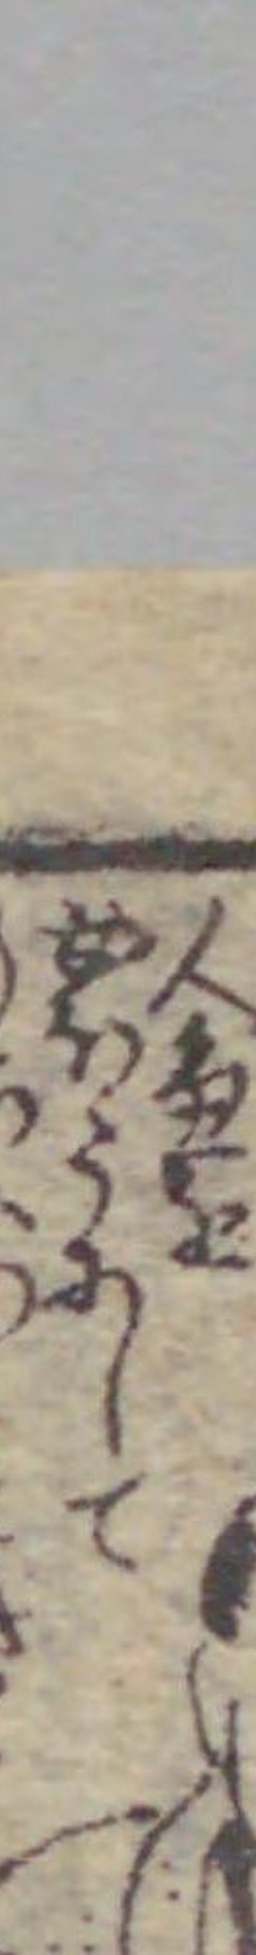女ほうにして
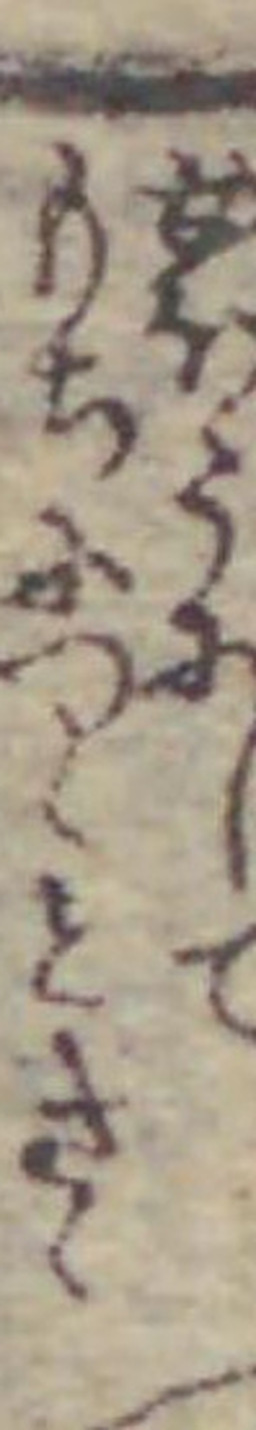もちにつくときゝ
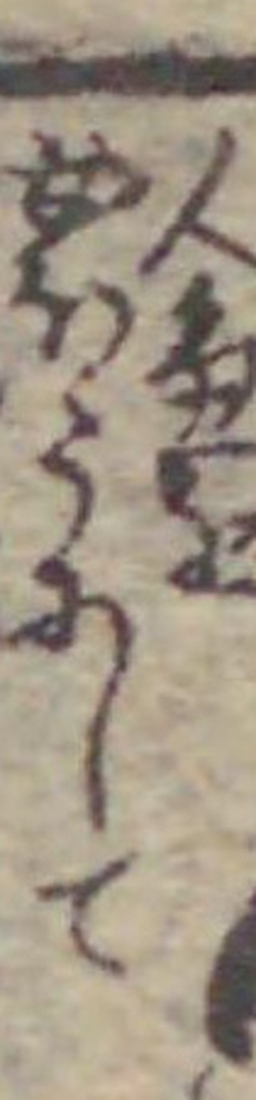女ほうにして
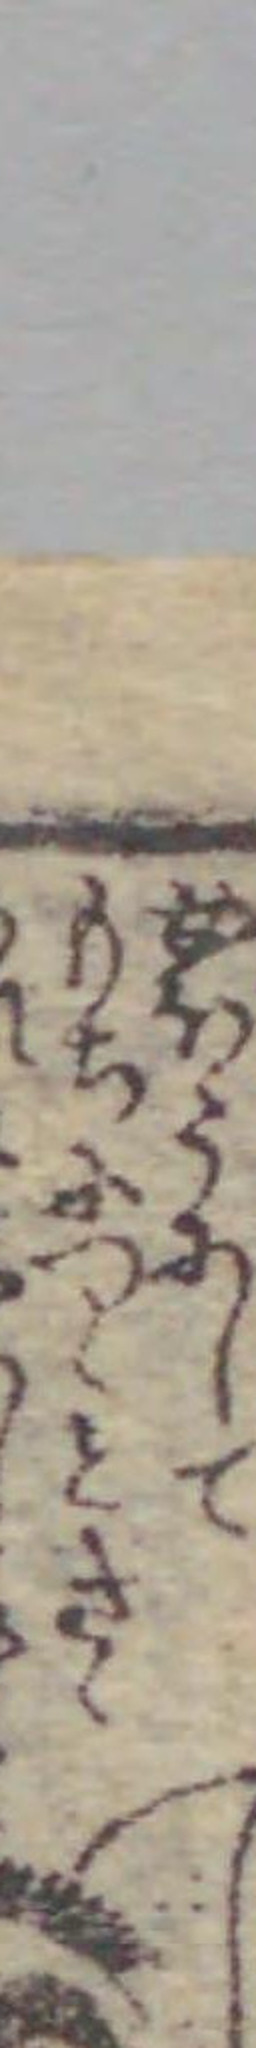もちにつくときゝ
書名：箱入娘面屋人魚 3巻
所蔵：国立国会図書館 National Diet Library, JAPAN
